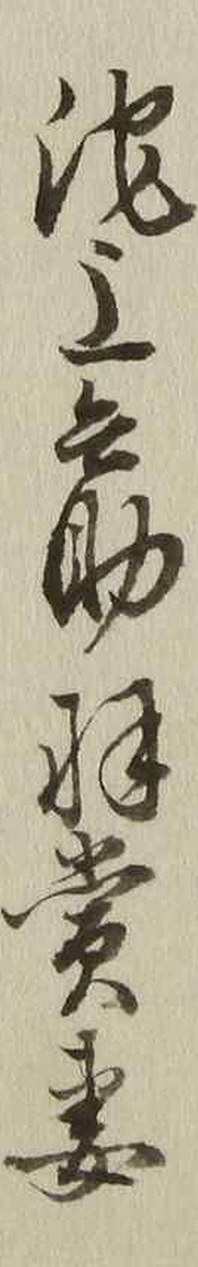女池上兵助羽賞妻
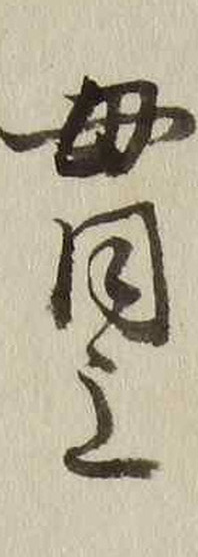母同上
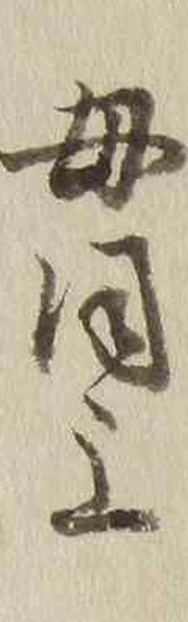母同上
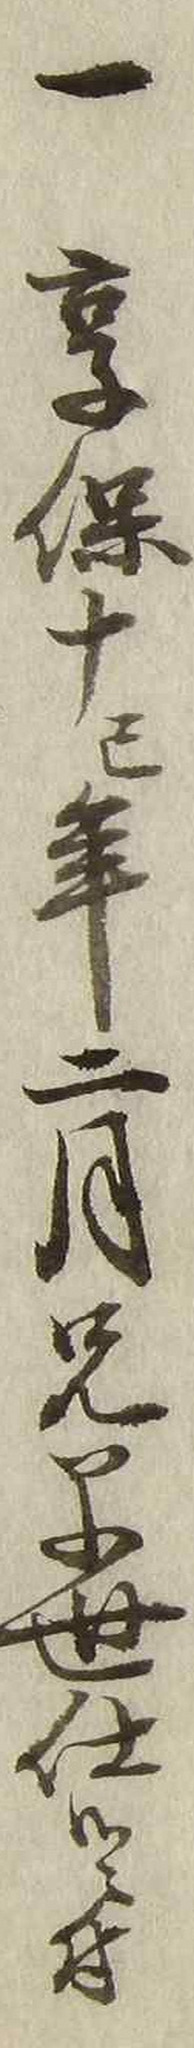一享保十巳年二月兄早世仕候ニ付
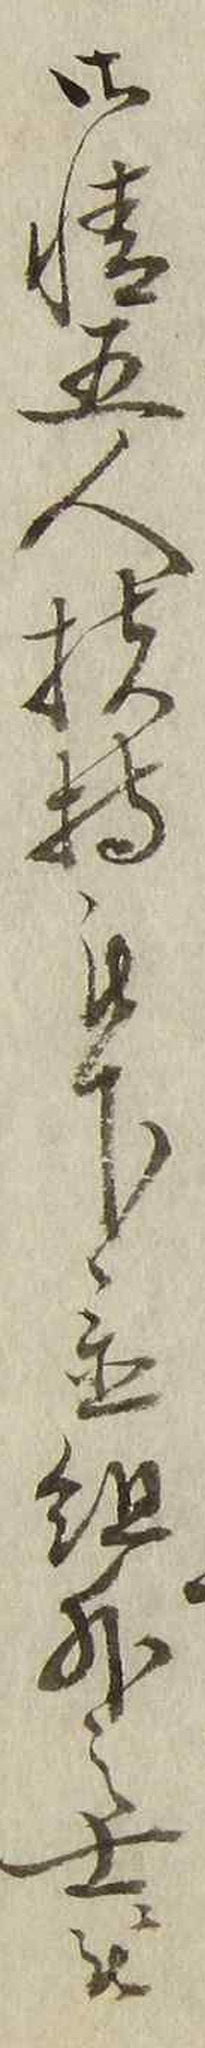御情五人扶持被下置組外之士ニ被

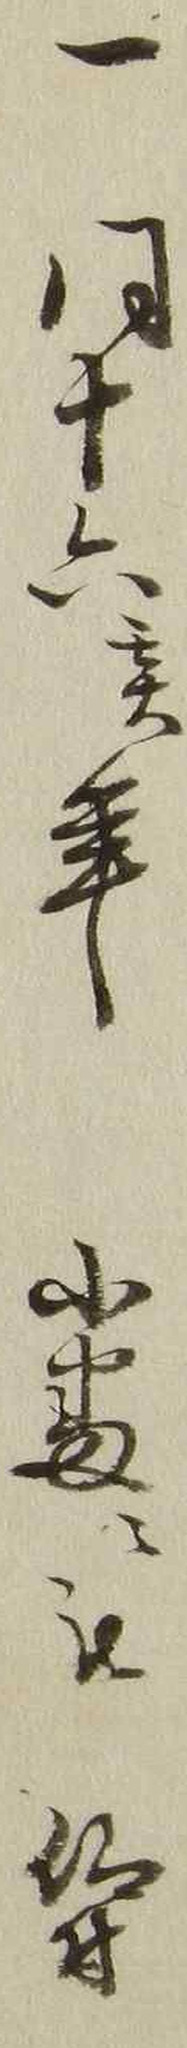一同十六亥年小番ニ被仰付
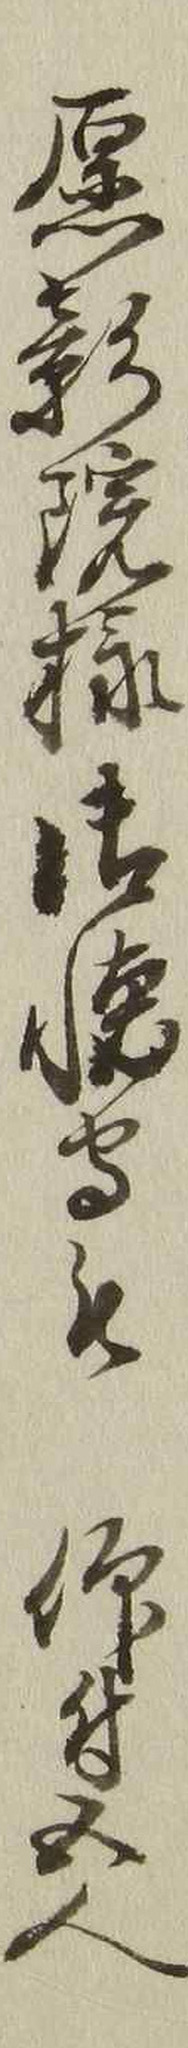愿彰院様御懐守被仰付五人
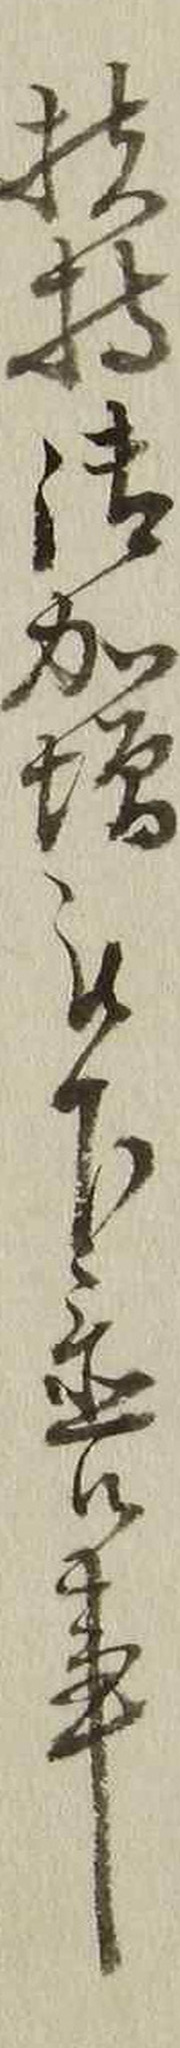扶持御加増被下置候事
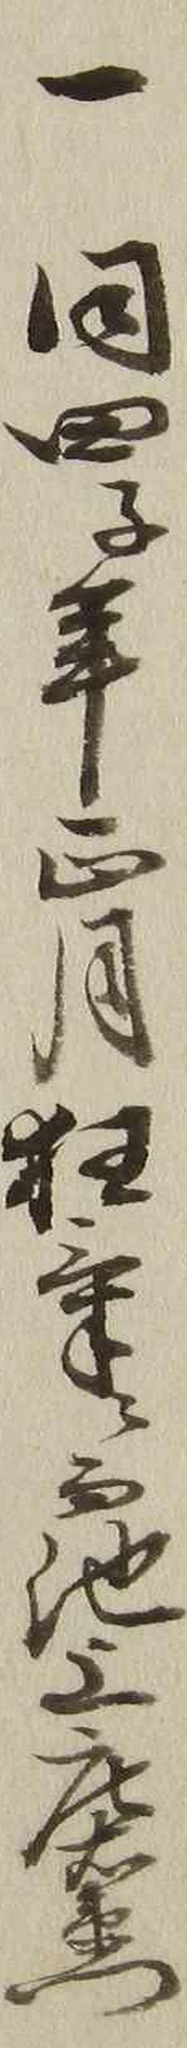一同四子年正月狂気ニ而池上庄右衛門
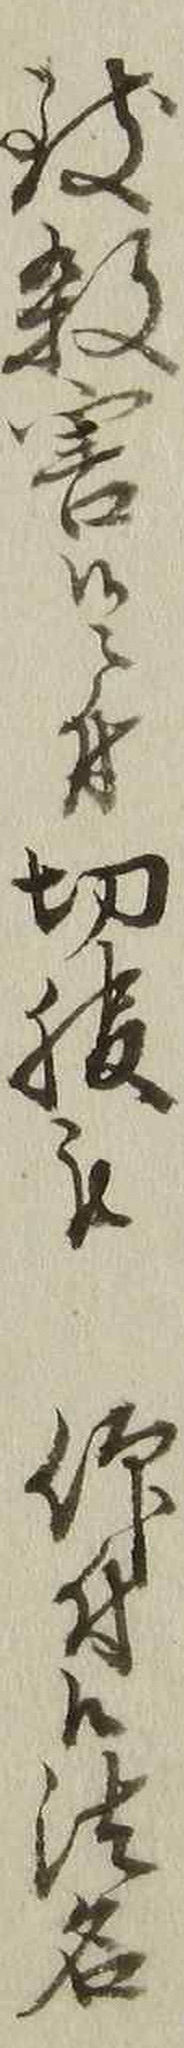致殺害候ニ付切腹被仰付候法名
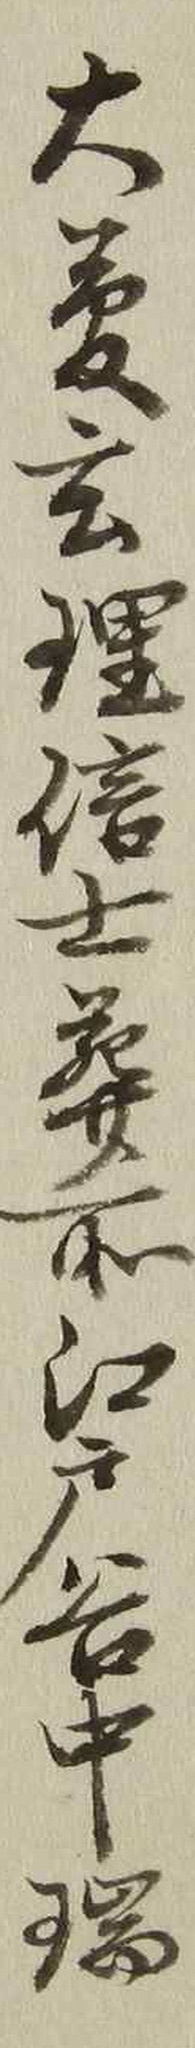大夢玄理信士葬所江戸谷中瑞
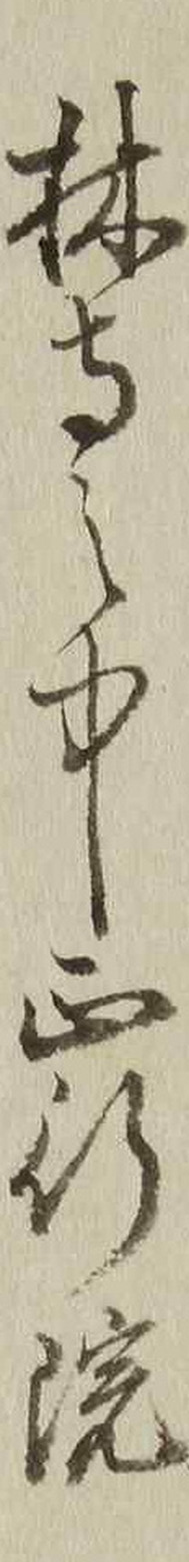林寺之中正行院
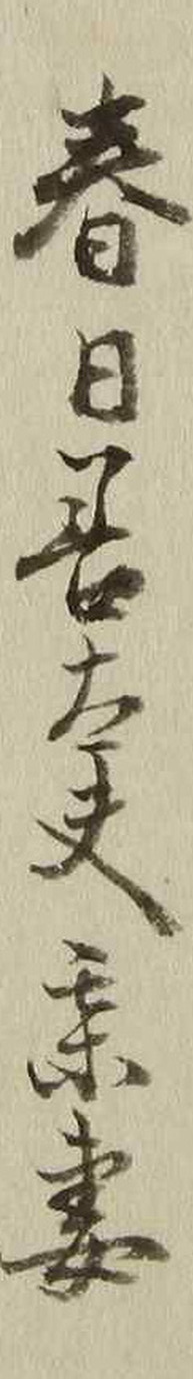女春日善太夫某妻
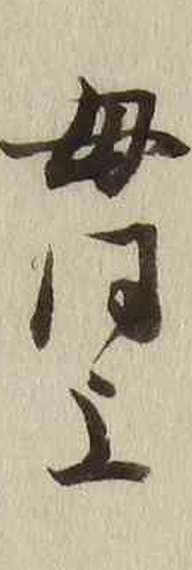母同上
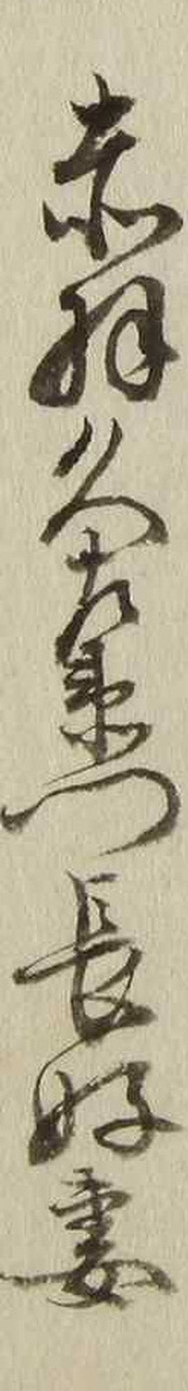女赤羽久左衛門長好妻
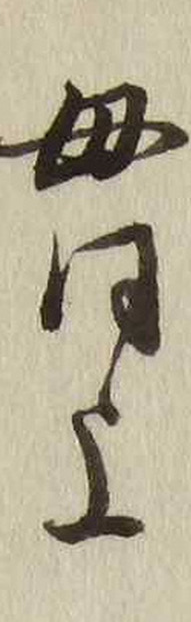母同上
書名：諸士系譜　巻之31　い之部31
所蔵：会津若松市立会津図書館
